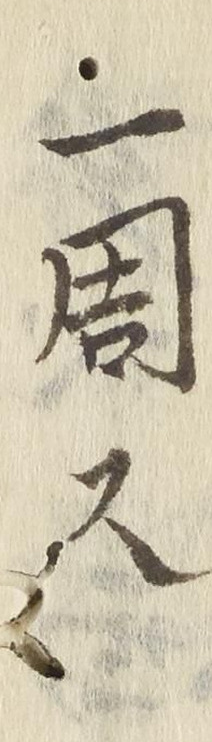一周ス
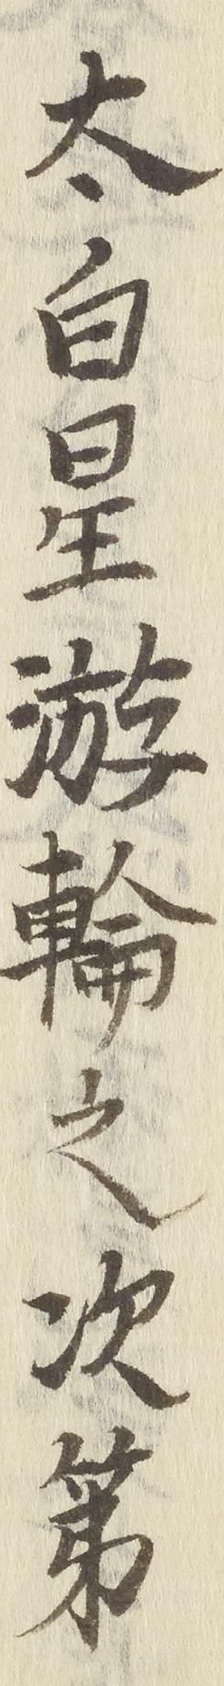太白星游輪之次第
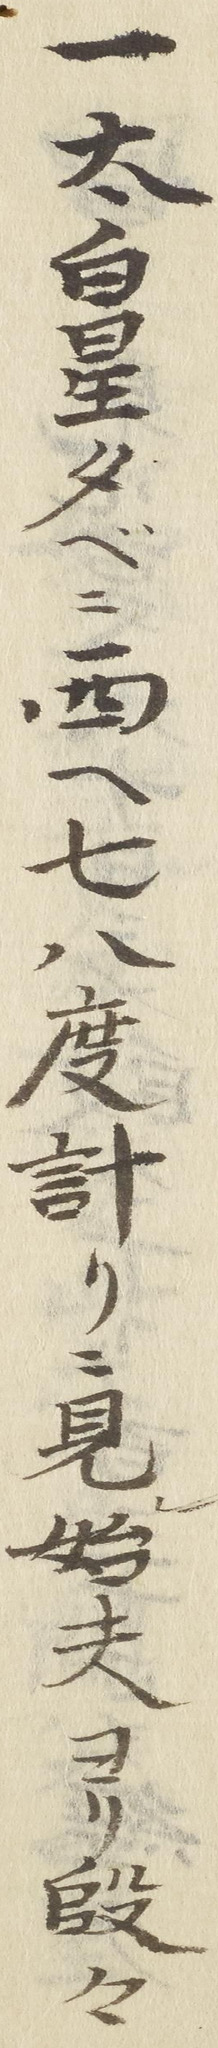一太白星夕ベニ西ヘ七八度計リニ見始夫ヨリ段々
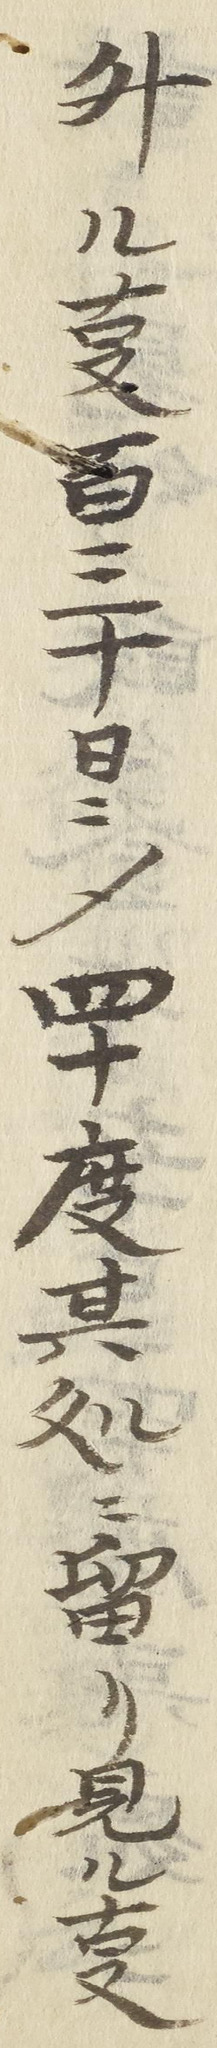外ル事百三十日ニシテ四十度其処ニ留リ見ル事
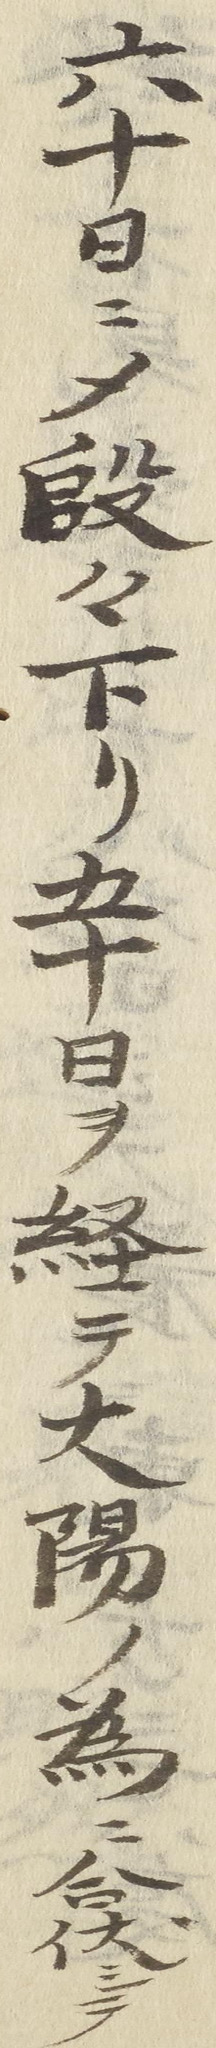六十日ニシテ段々下リ五十日ヲ経テ大陽ノ為ニ合伏シテ

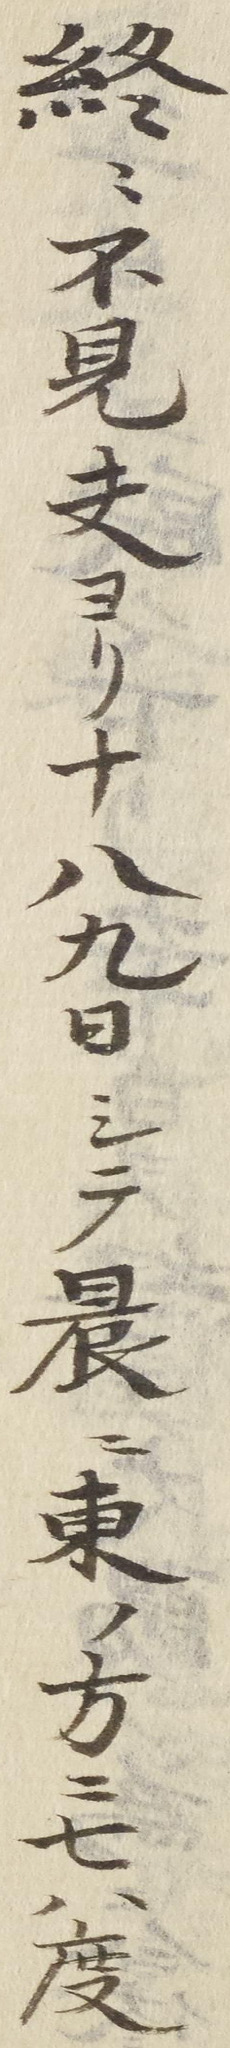終ニ不見夫ヨリ十八九日シテ晨ニ東ノ方ニ七八度
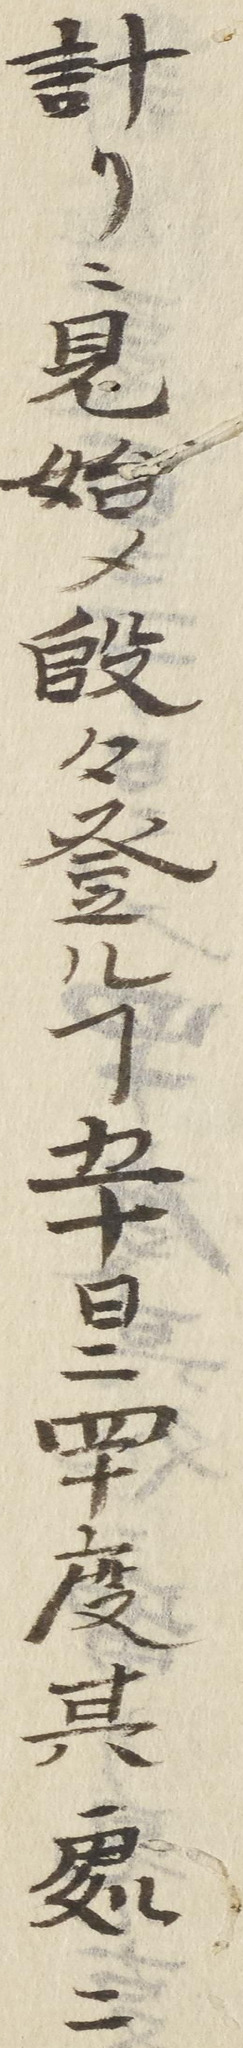計リニ見始メ段々登ルコト五十日ニ四十度其処ニ
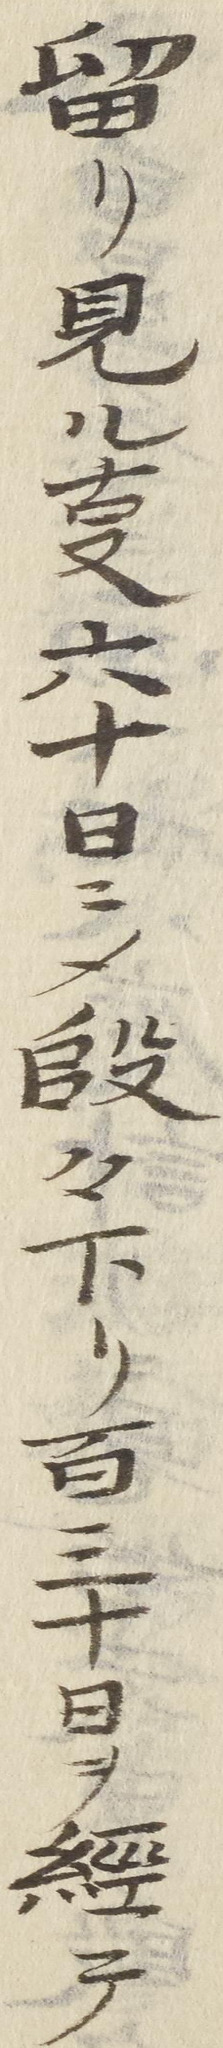留リ見ル事六十日ニシテ段々下リ百三十日ヲ経テ
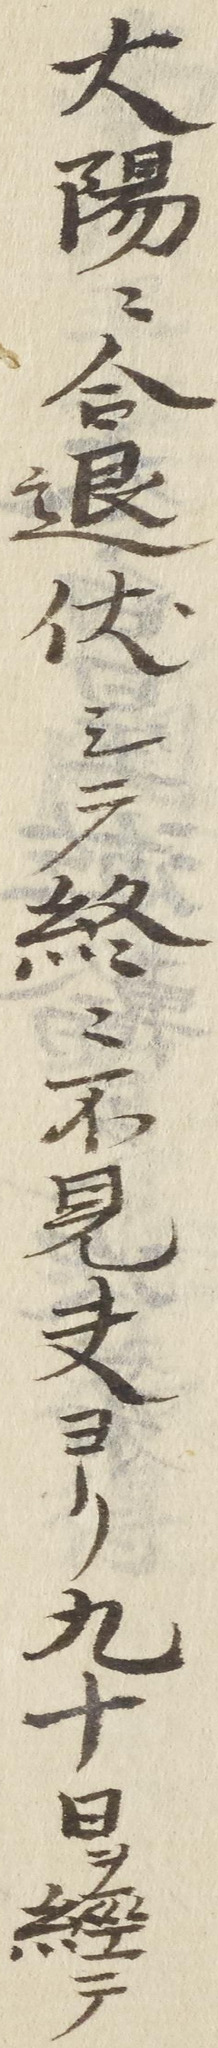大陽ニ合退伏シテ終ニ不見夫ヨリ九十日ヲ経テ
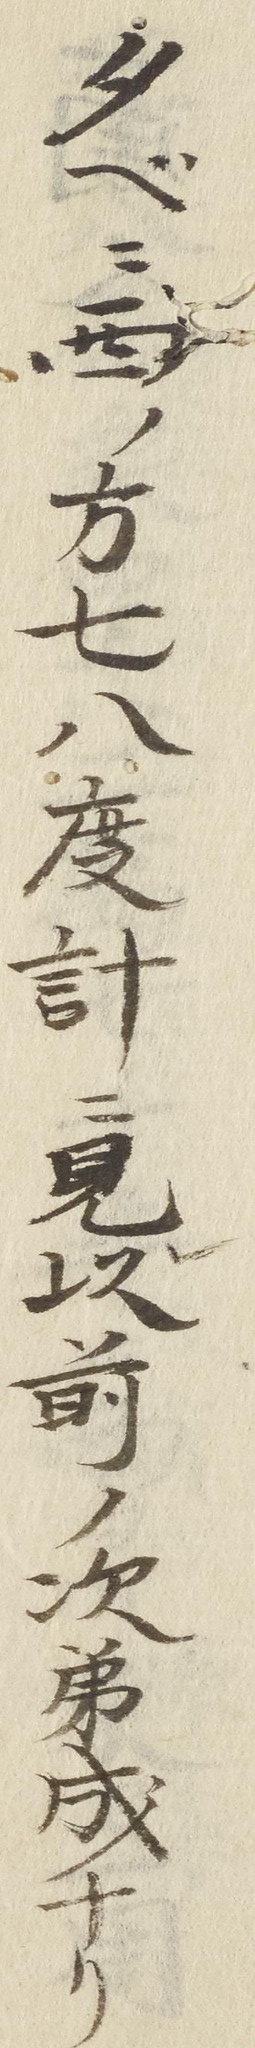夕べニ西ノ方七八度計ニ見レ以前ノ次第成ナリ
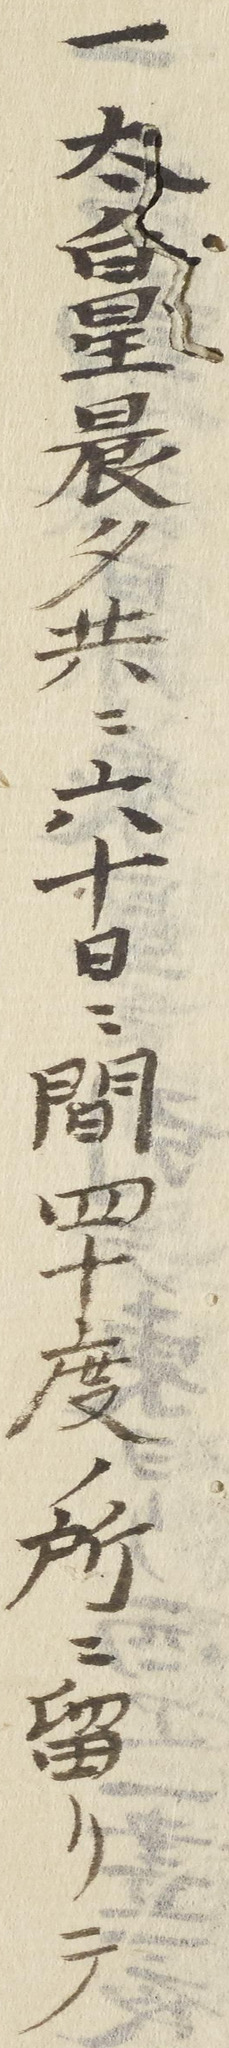一太白星晨夕共ニ六十日ニ間四十度ノ所ニ留リテ
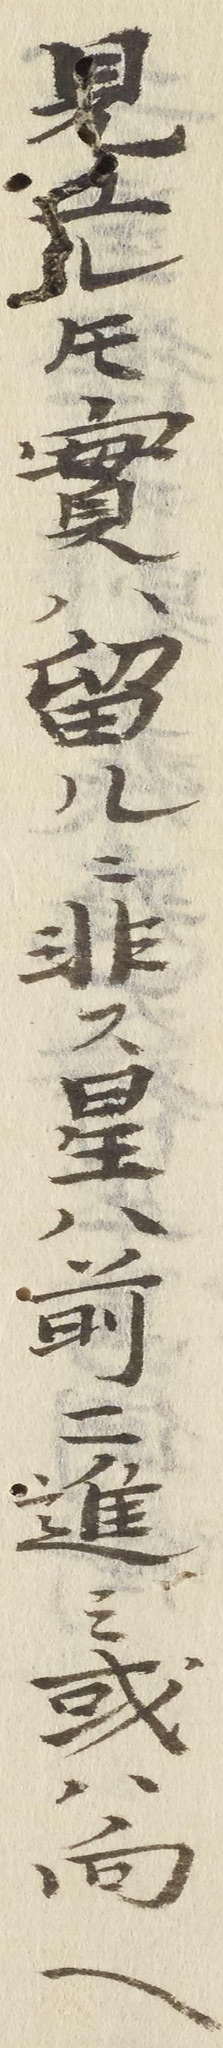見ユレトモ実ハ留ルニ非ス星ハ前ニ進ミ或ハ向ヘ
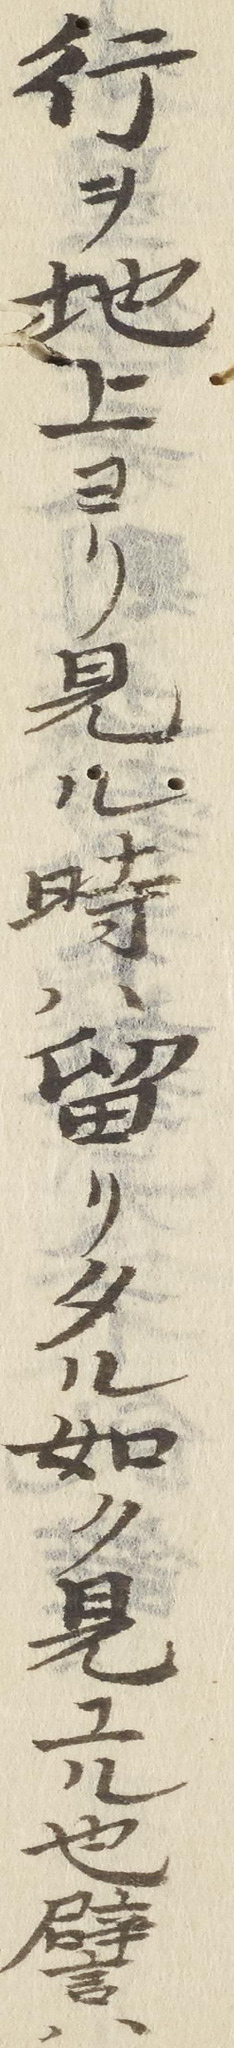行ヲ地上ヨリ見ル時ハ留リタル如ク見ユル也譬ハ
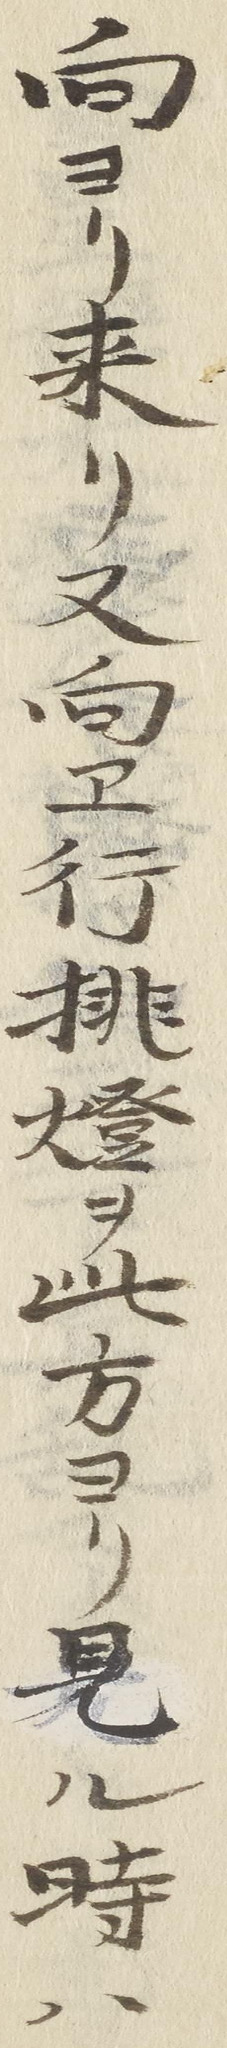向ヨリ来リ又向ヱ行排燈ヲ此方ヨリ見ル時ハ
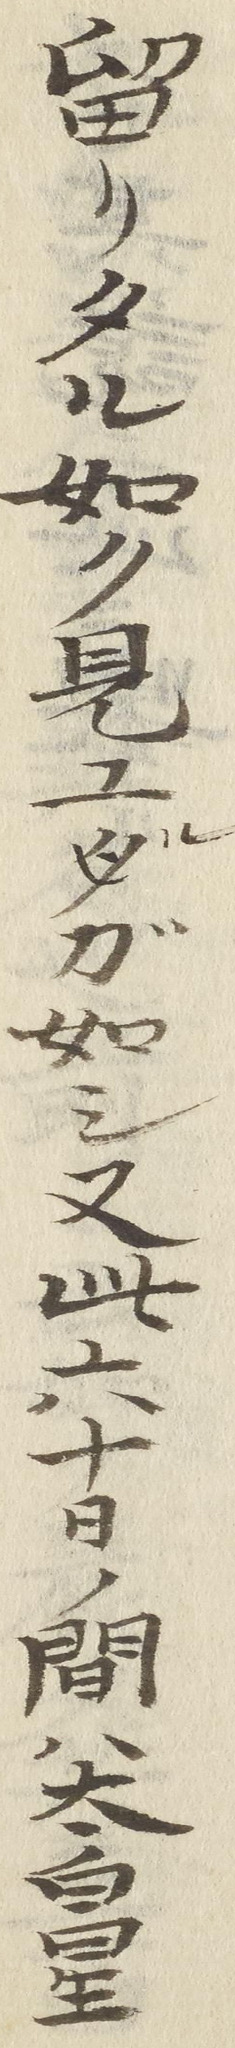留リタル如ク見ユタガ如シ又此六十日ノ間ハ太白星
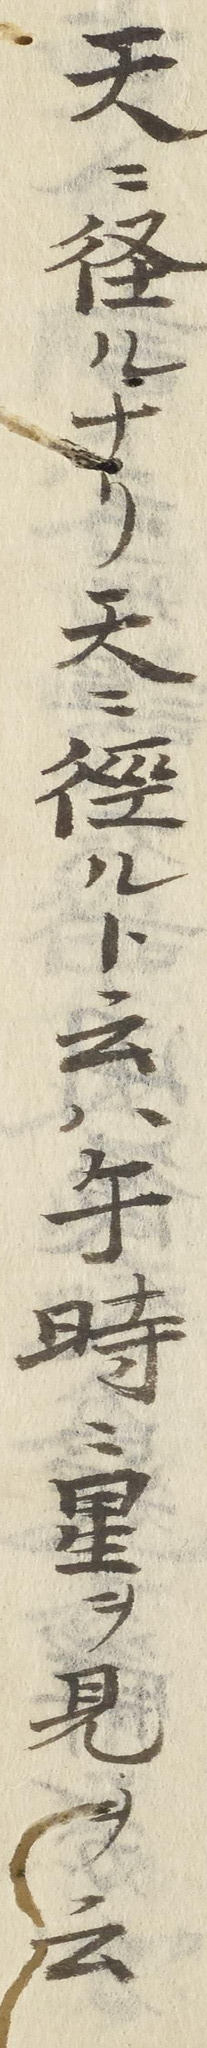天ニ径ルナリ天ニ径ルト云ハ午時ニ星ヲ見ヲ云
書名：天象話説
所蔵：東京大学地震研究所図書室 Earthquake Research Institute Library, The University of Tokyo, JAPAN
